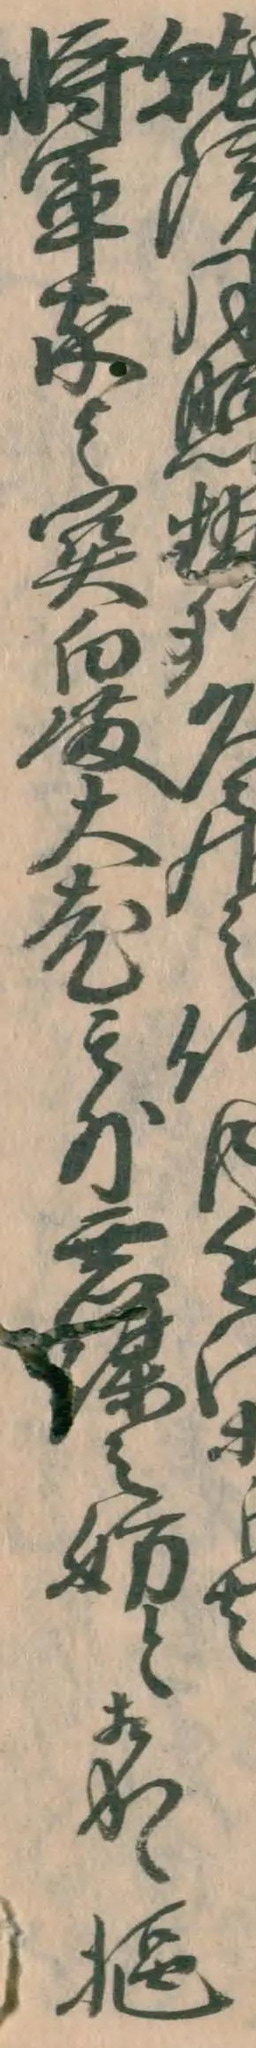将軍家と関白殿大老其外悪謀之妨と相成候樞
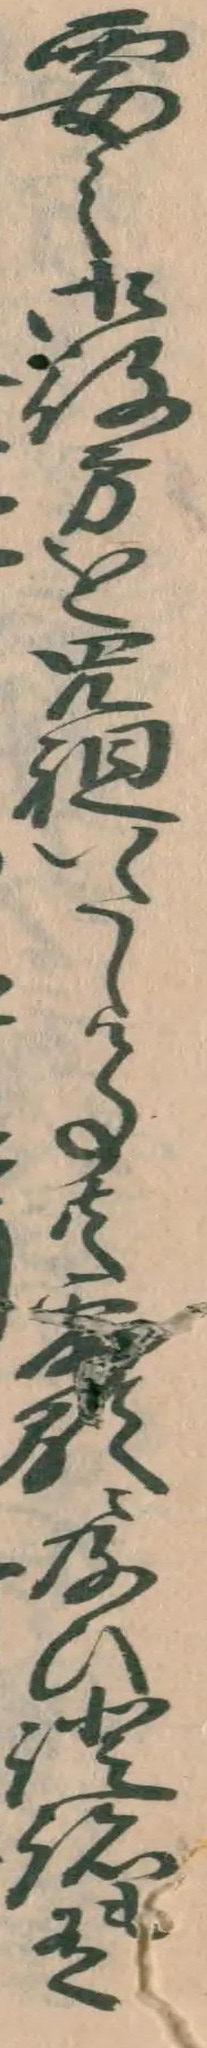要之御役方を呪詛いたし候事共露顕ニ及ひ證跡も有
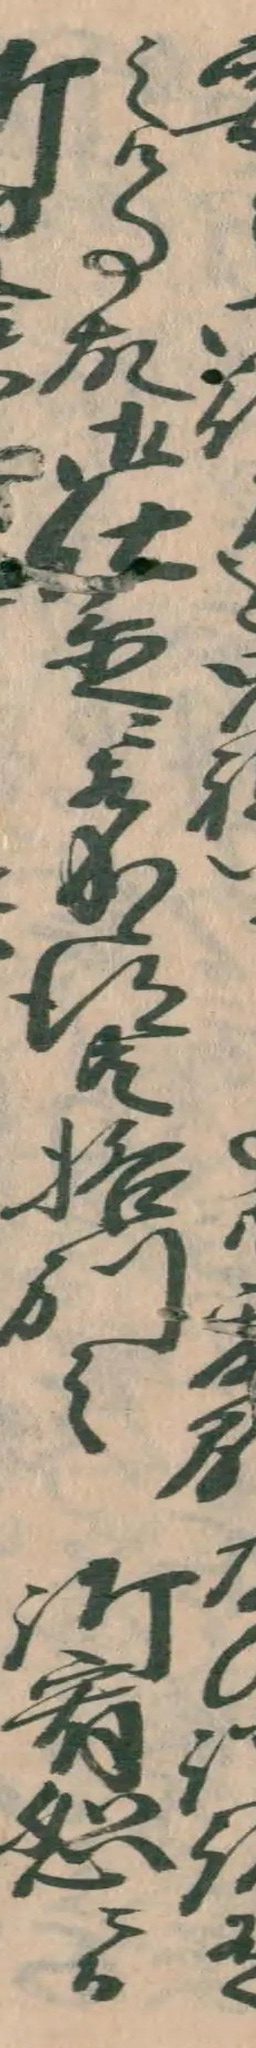之候事故御仕置ニ相成候得共格別之御宥恕ニ而
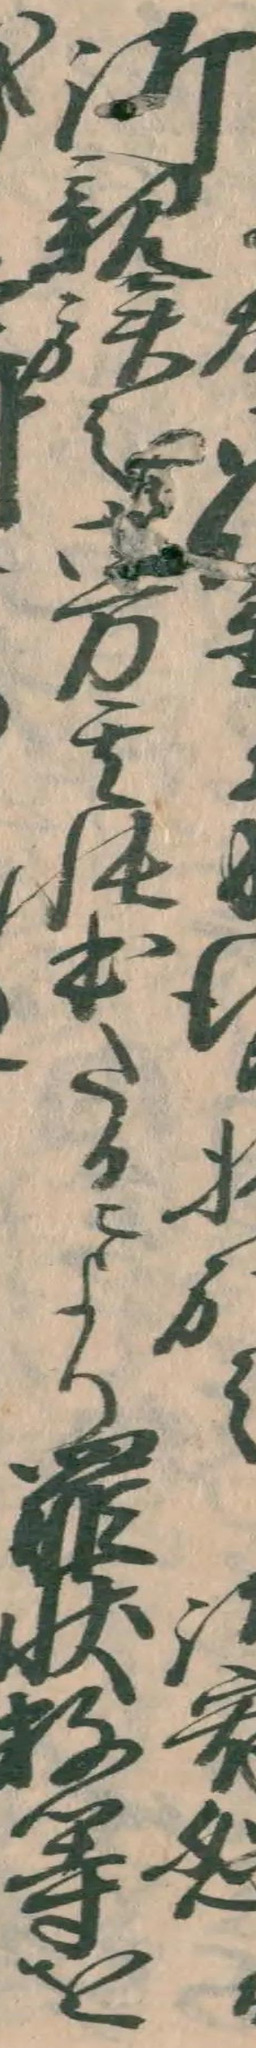御親族之御方其張本たるニより罪状数等を
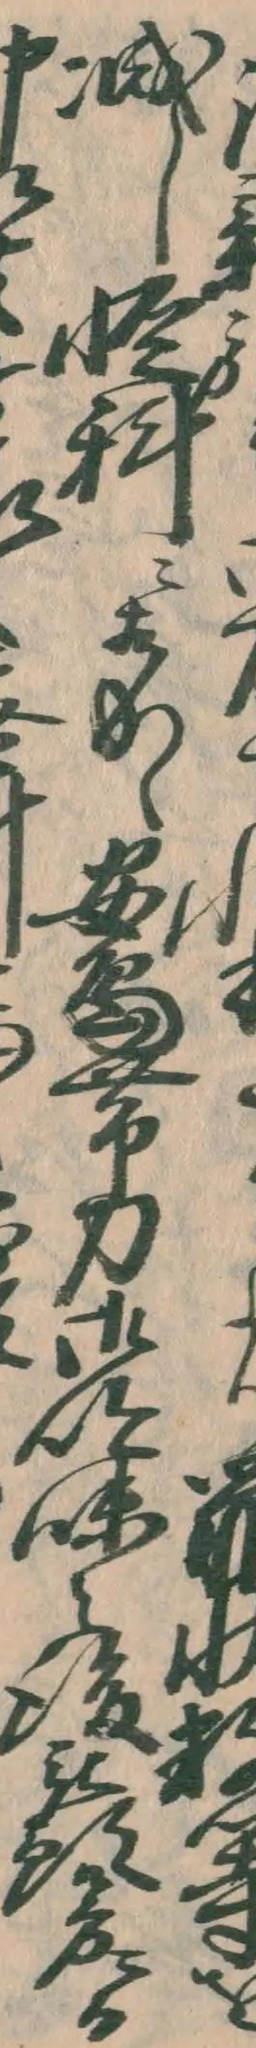減し軽科ニ相成候安嶋帯刀御吟味之後被預候方ニ而
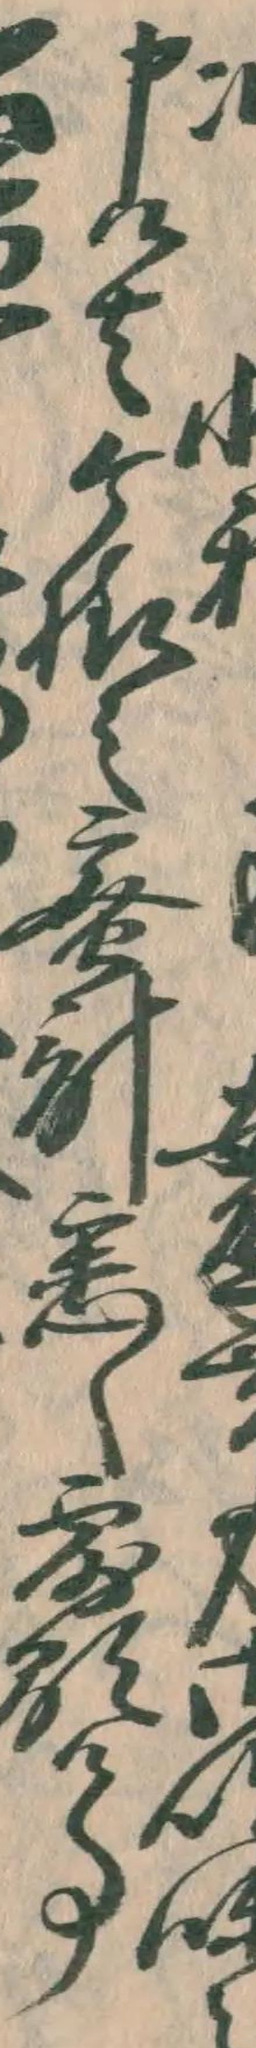申候者ケ様之蜜計悉く露顕候事
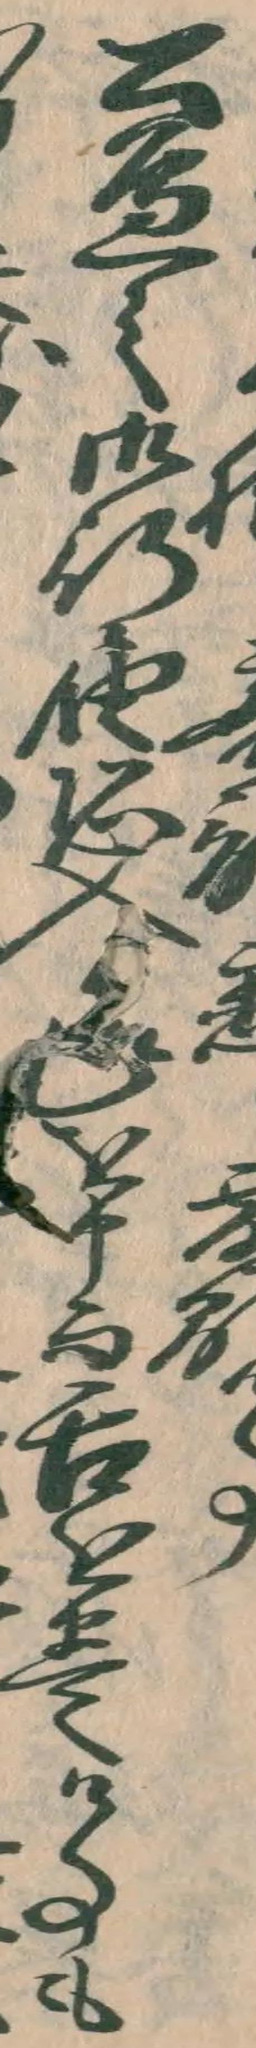公邊之御行届恐入候趣を申而舌を巻候事も
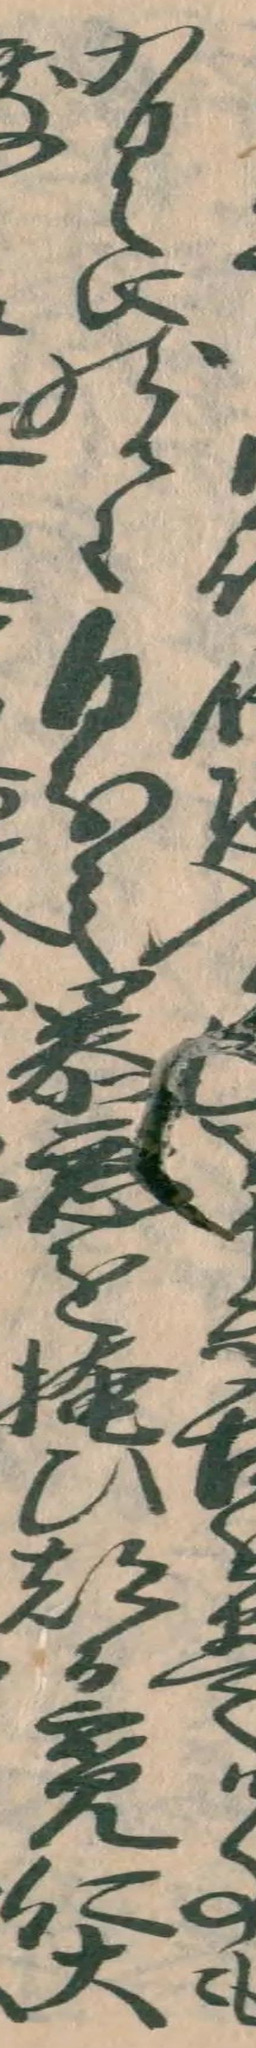有之由然ルに自分之謀悪を掩ひ都而寛仁大
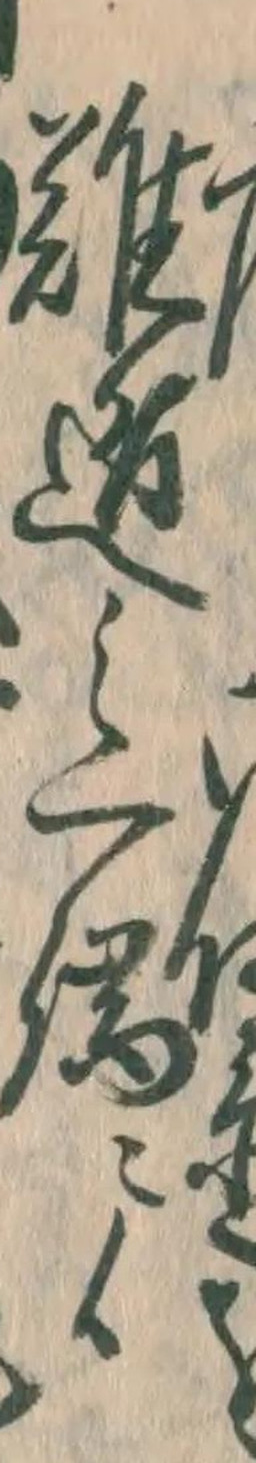難遁之一端ニ候
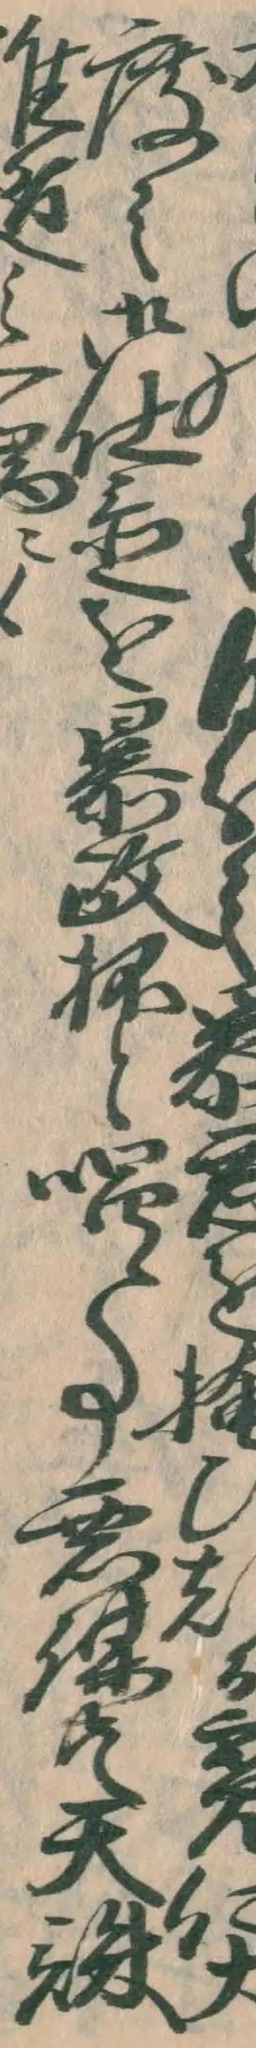度之御仕置を暴政抔と唱候事悪謀共天誅
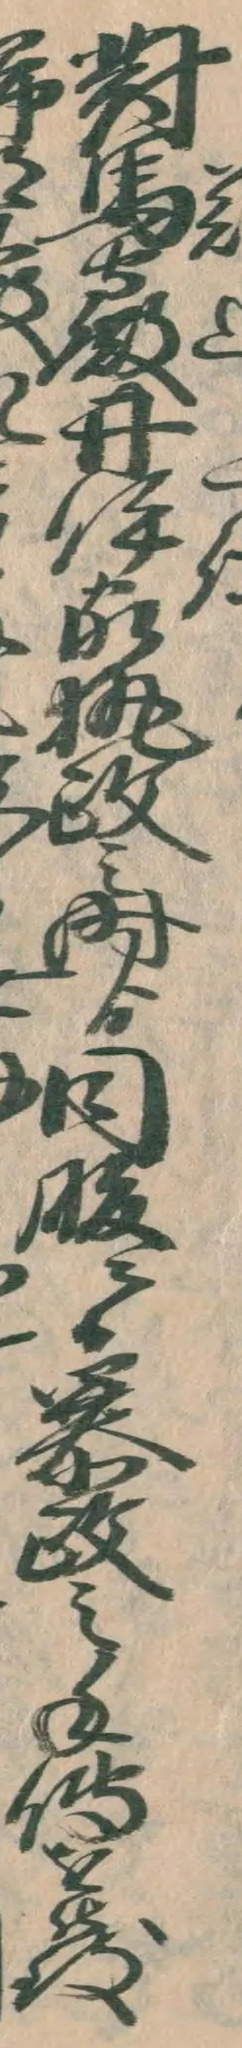對馬守殿井伊家執政之時ゟ同腹ニ而暴政之手傳を被致
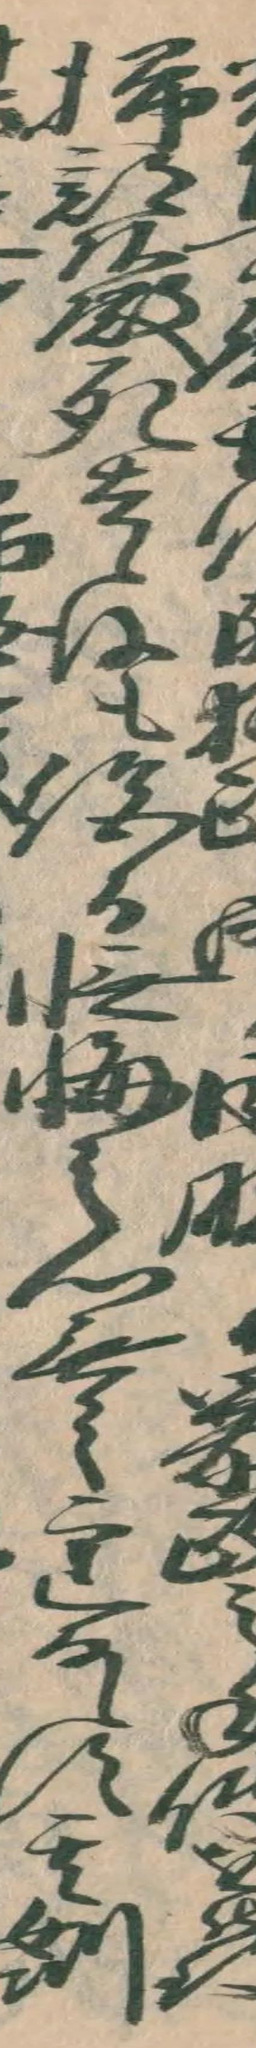掃部頭殿死去候後も絶而撫悔之心無之而已ならす其姧
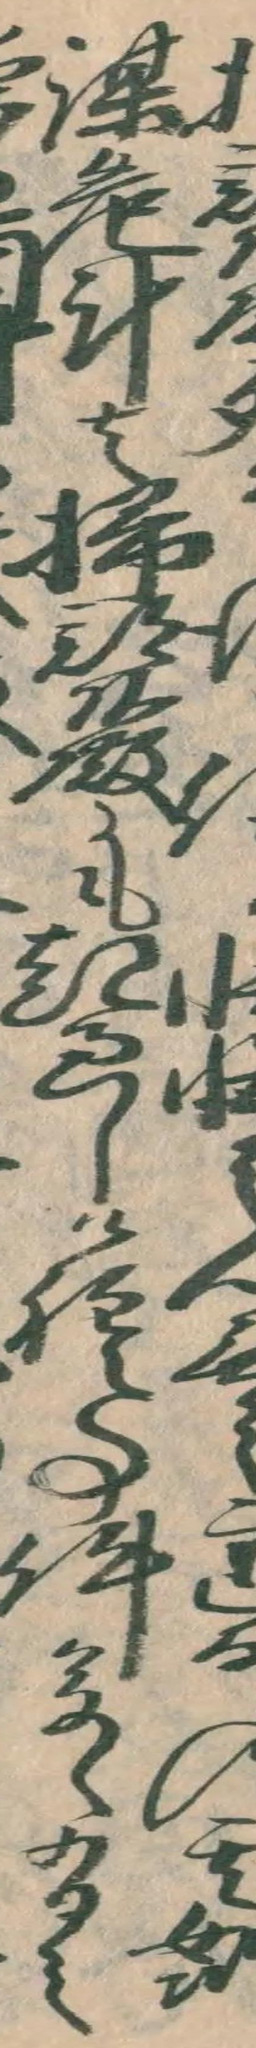謀危計者掃部頭殿にも起過し候程之事件多く有之
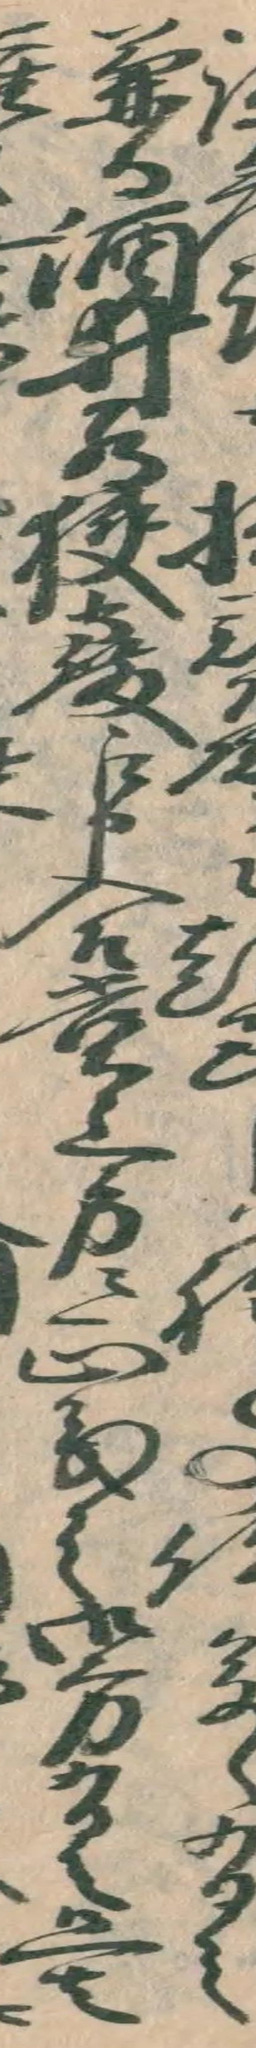兼而酒井若狭守殿江申合堂上方ニ正義之御方有之候へ者
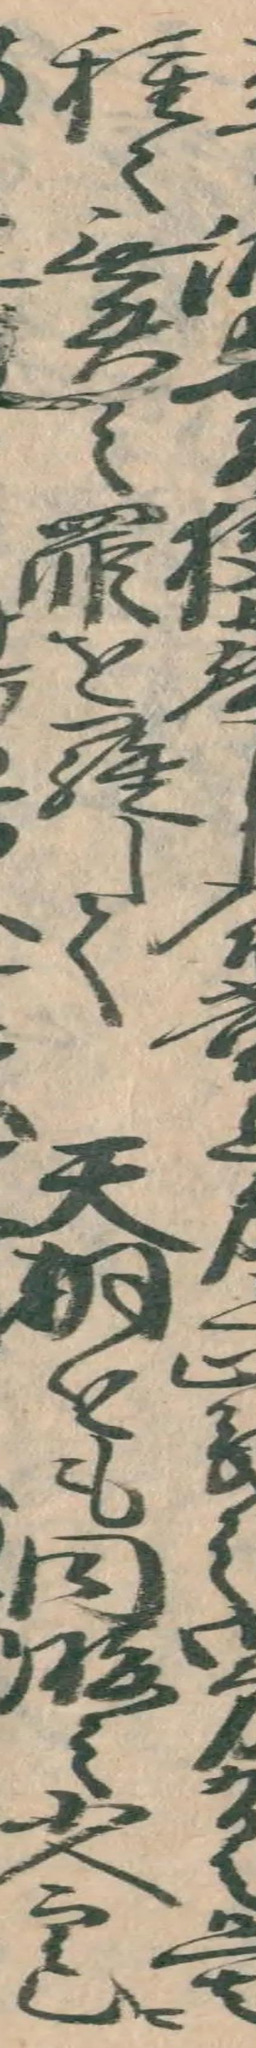種々無失之罪を羅して天朝をも同腹之小人而已ニ
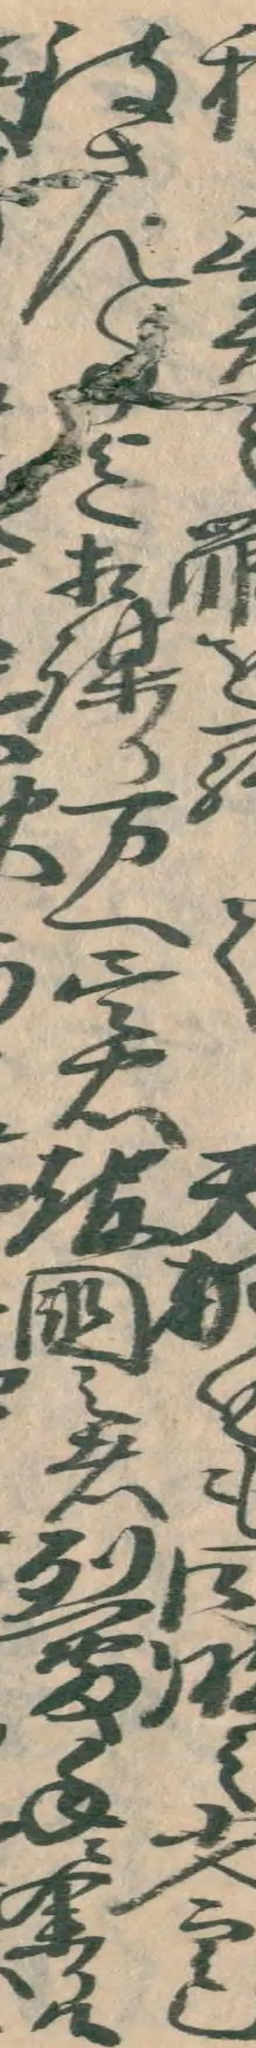致さん事迄相謀り万一尽忠報国之者烈敷手ニ余り候
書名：麗斎叢書. 20
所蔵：国立国会図書館 National Diet Library, JAPAN
